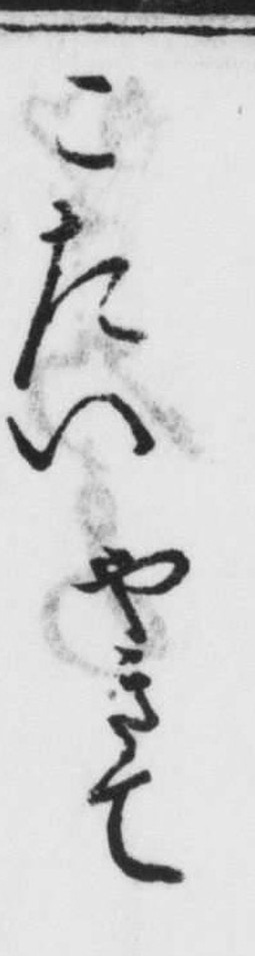こたいやきて
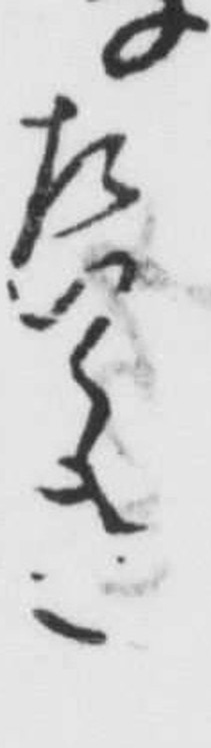たいらき
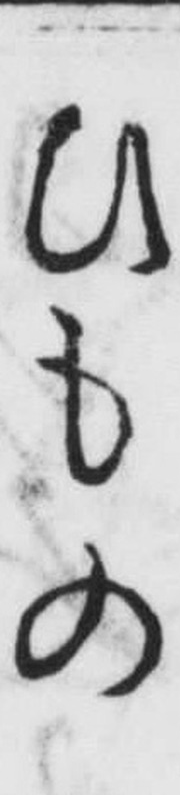ひもの

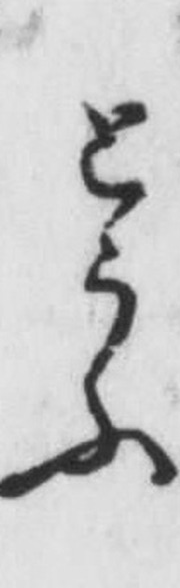とうふ
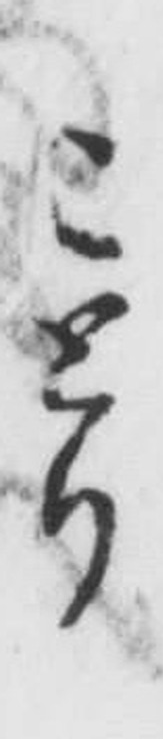ことり
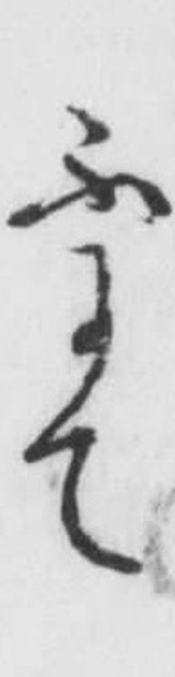ふにて
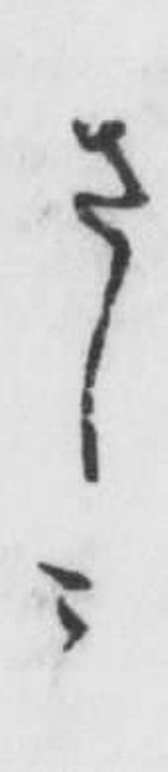さしミ
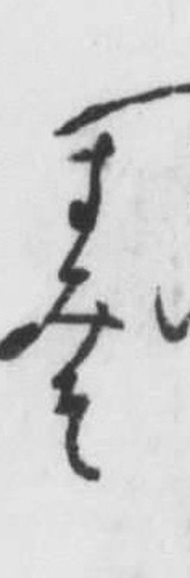すみそ
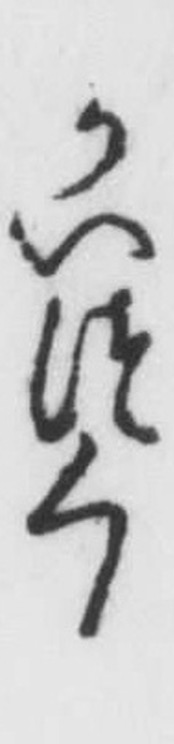かいつくし
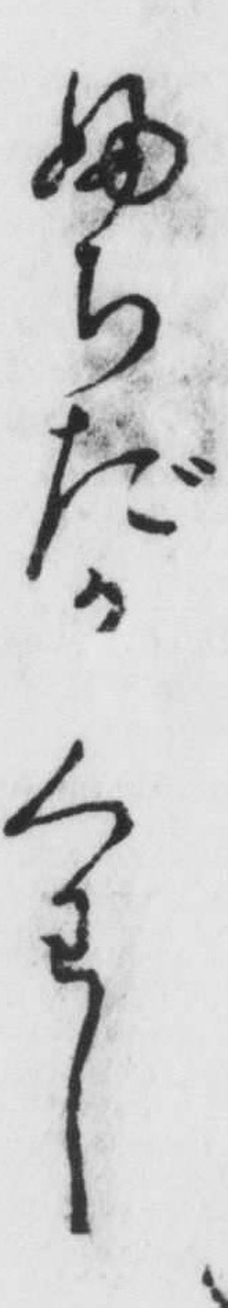ふちだかくわし
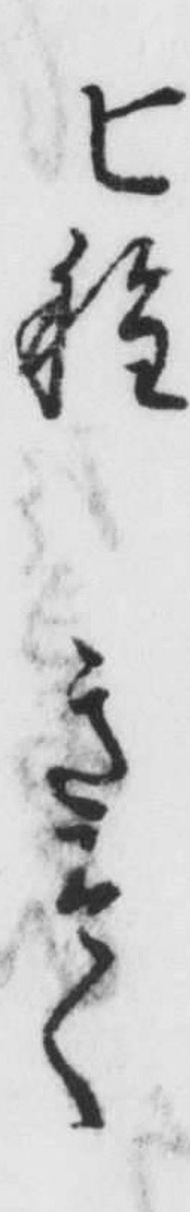七種きそく
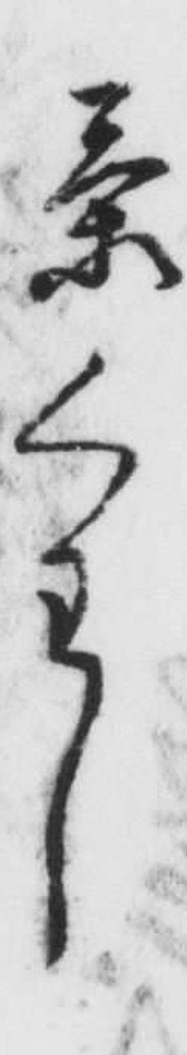茶くわし
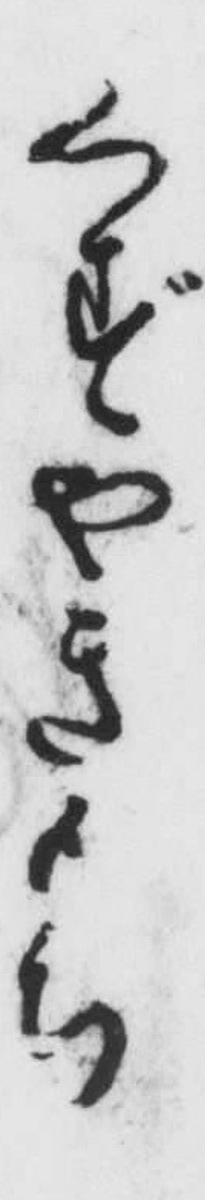くずやきもち
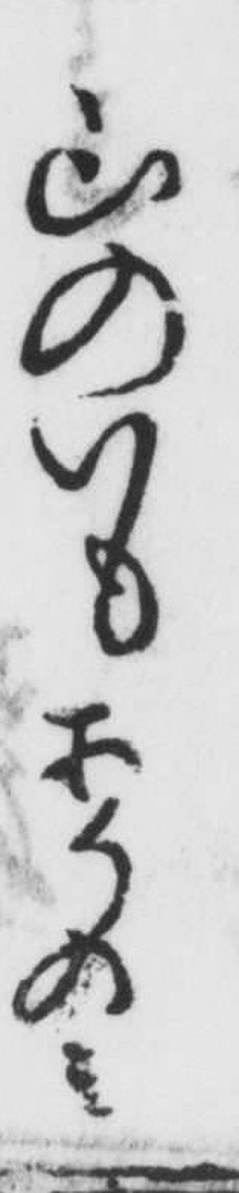山のいもありのミ
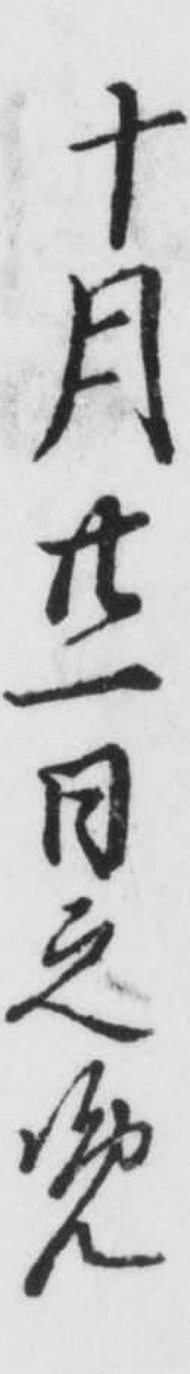十月廿一日之晩
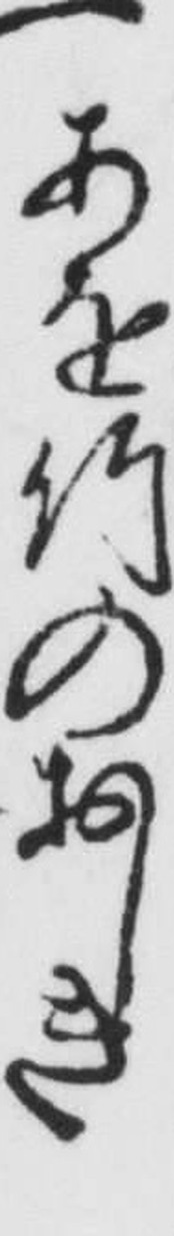二あを竹のおしき
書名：料理切形秘伝抄
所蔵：大阪府立大学学術情報センター 国文学研究資料館
